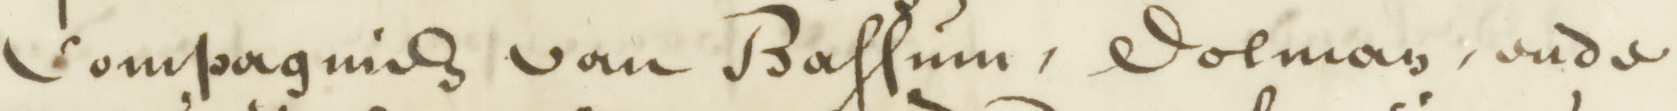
Compagnien van Bassum, Dolman, ende
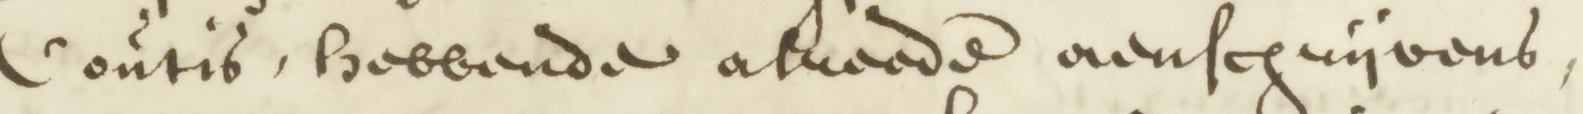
Coutis, hebbende alreede aenschrijvens
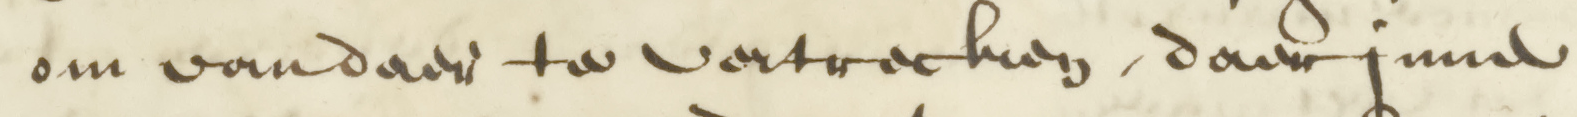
om vandaer te vertrecken, daer inne
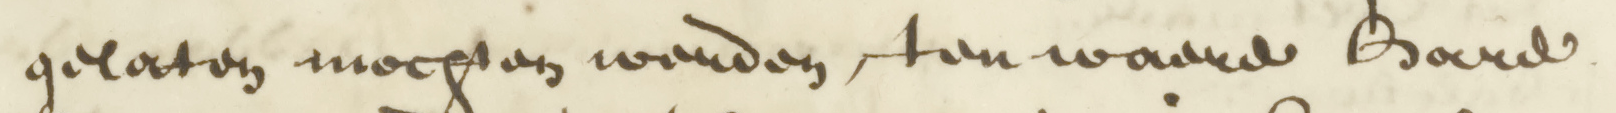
gelaten mochten werden, ten waere hare
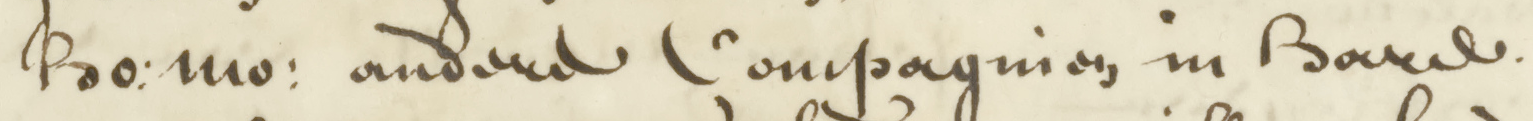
Ho: Mo: andere Compagnien in hare
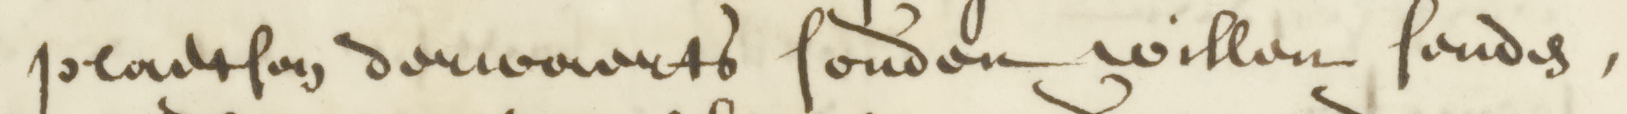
plaetsen derwaerts souden willen senden,
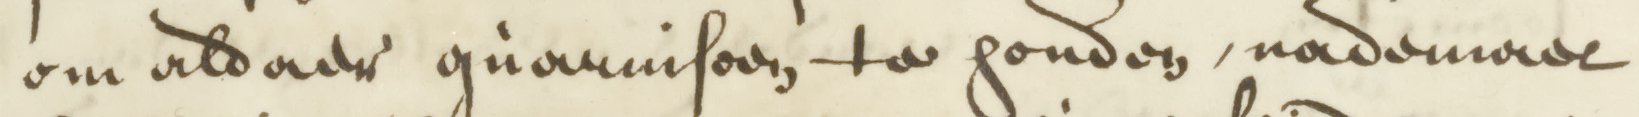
om aldaer quarnisoen te houden, nademael
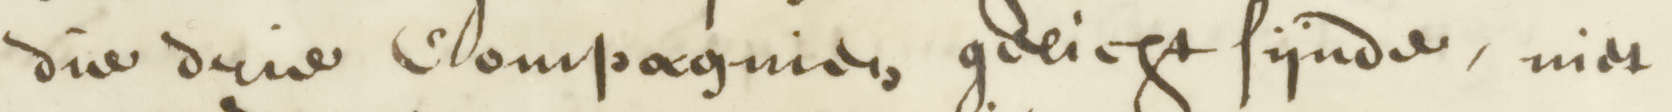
die drie Compagnien gelicht sijnde, niet
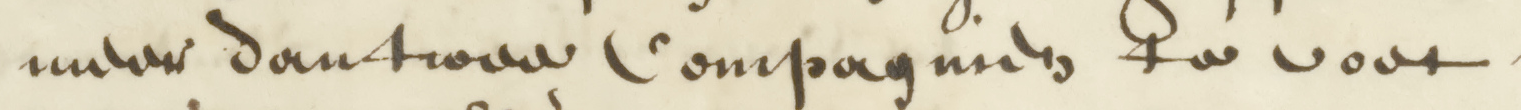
meer dan twee Compagnien te voet
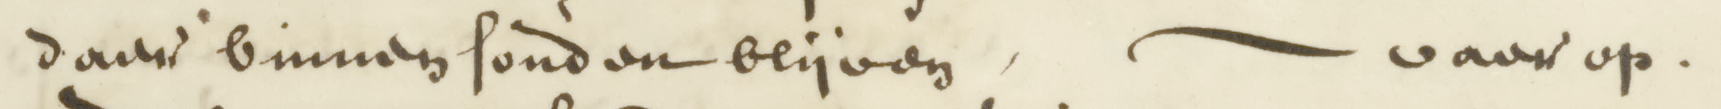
daer binnen souden blijven. Waer op
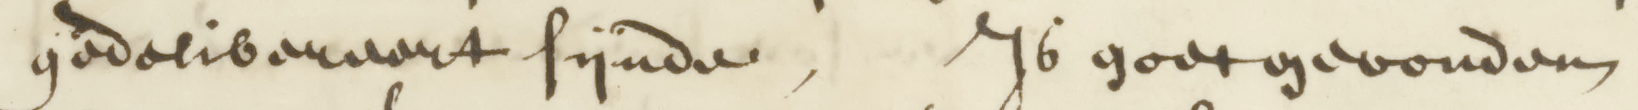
gedelibereert sijnde, Is goetgevonden
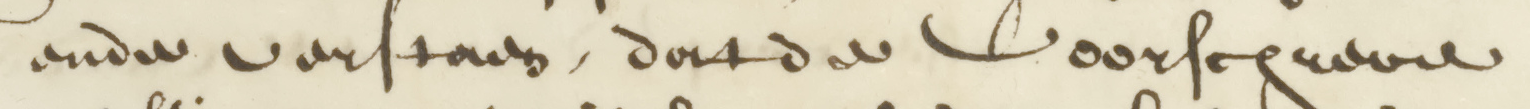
ende verstaen, dat de voorschreve
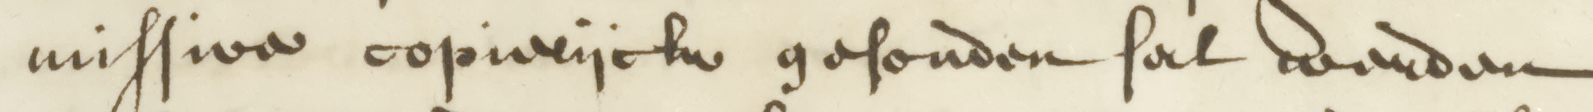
missive copielijck gesonden sal werden
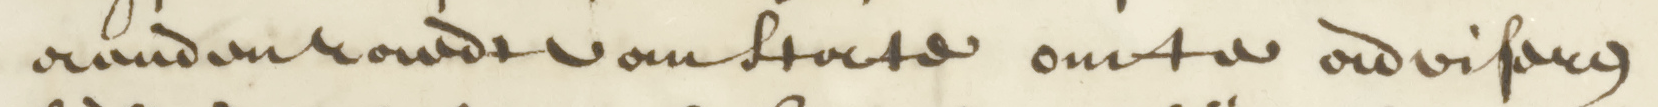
aenden raedt van State omte adviseren
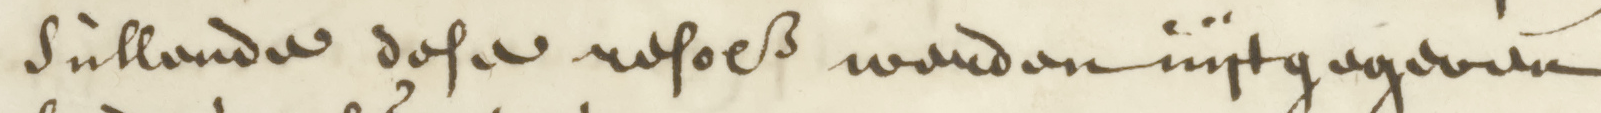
Sullende dese resol werden uijtgegeven
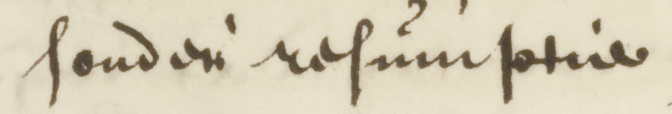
sonder resumptie.
